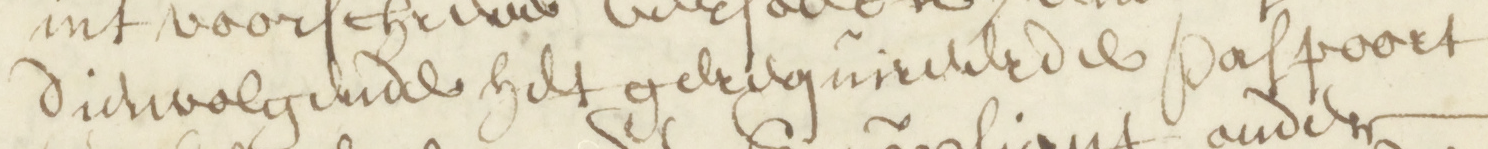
dienvolgende het gerequireerde Paspoort
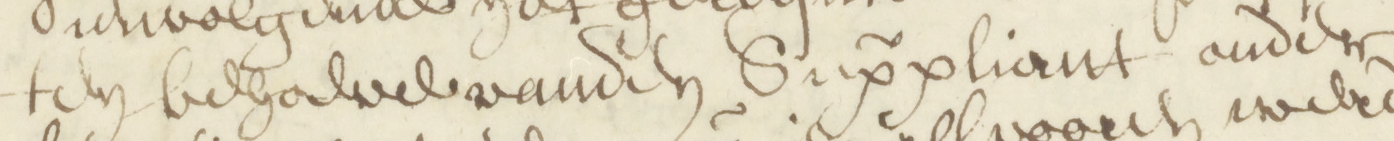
ten behoeve vanden Suppliant onder
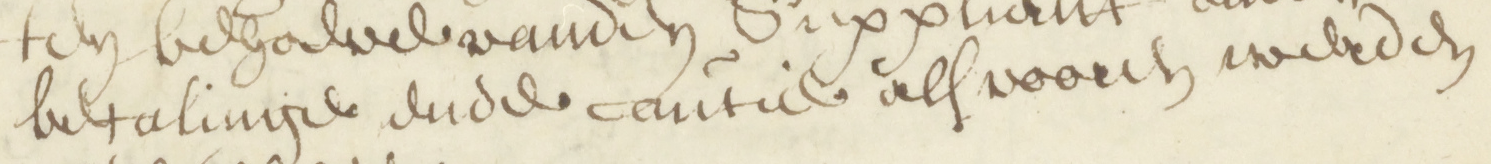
betalinge ende cautie alsvooren werden
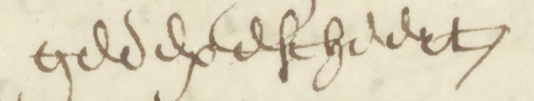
gedepescheert.
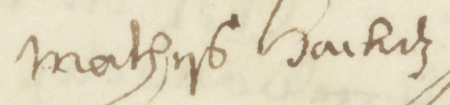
Mathys Hacken
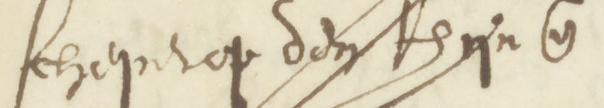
schepen op den Rhijn &
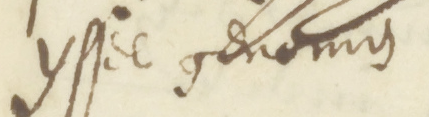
Yssel genomen
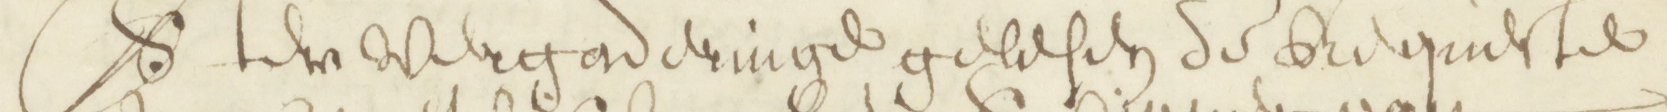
Is ter Vergaderinge gelesen de Requeste
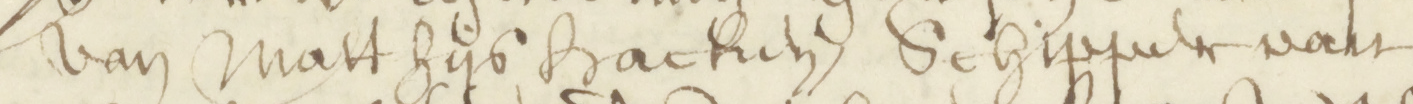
van Matthijs Hacken, Schipper van
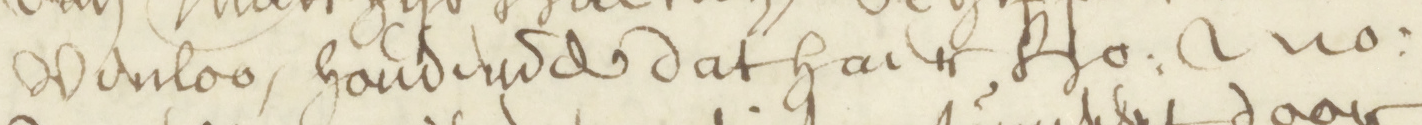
Venloo, houdende dat haer Ho:Mo:
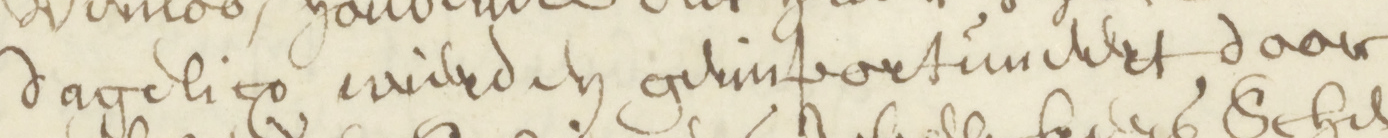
dagelicx wierden geinportuneert door
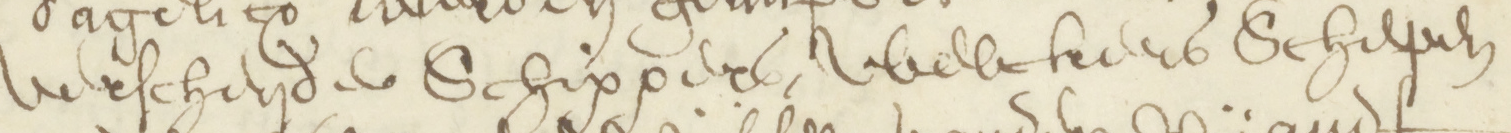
verscheijde Schippers welckers Schepen
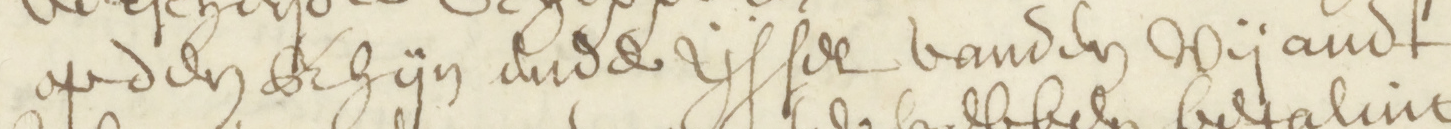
op den Rhijn ende IJssel vanden Vijandt
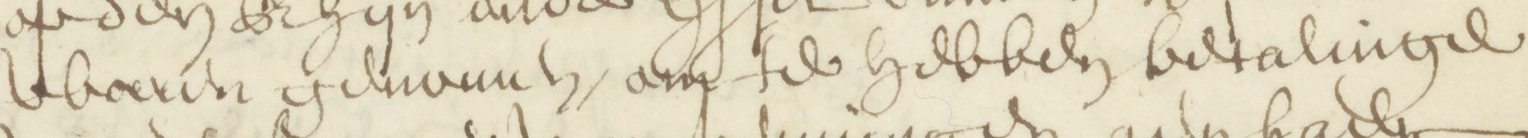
waren genomen, om te hebben betalinge
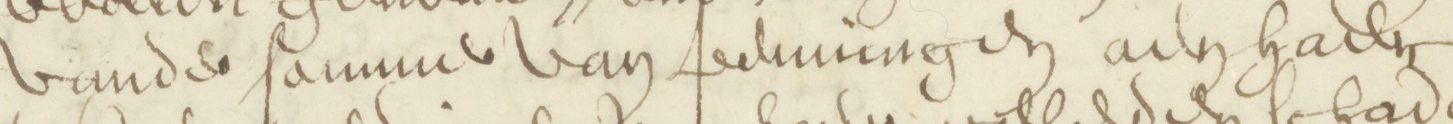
vande somme van penningen aen haer
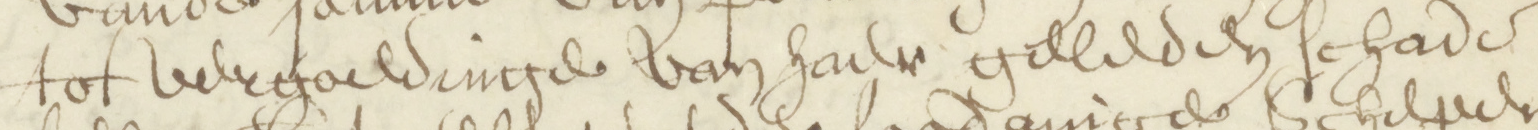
tot vergoedinge van haer geleden schade
